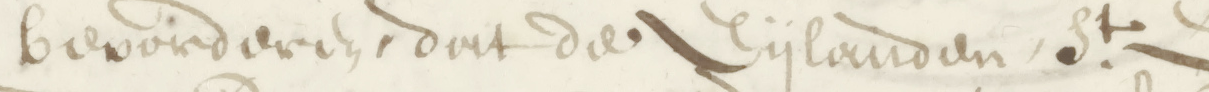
bevorderen, dat de Eijlanden, St. Eustache, Tabago,
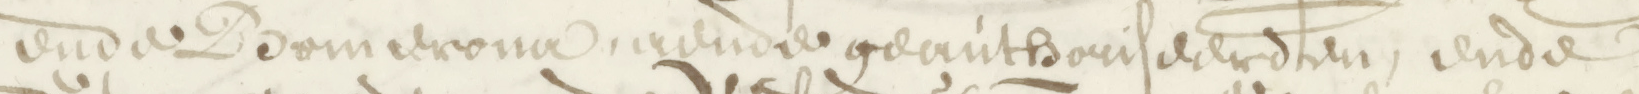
ende Bomerona, aende geauthoriseerden, ende
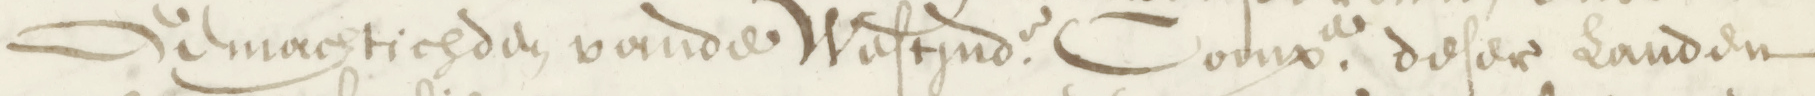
Gemachtichden vande Westinde. Compe. deser Landen
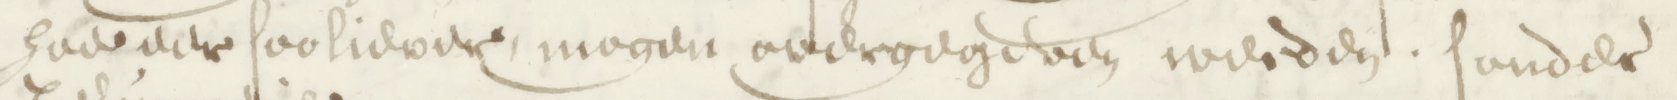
hoe eer soo liever, mogen overgegeven werden sonder
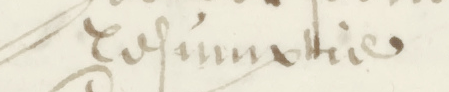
Resumptie.
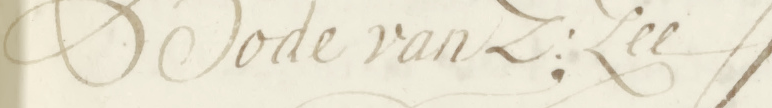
Bode van Z.Zee
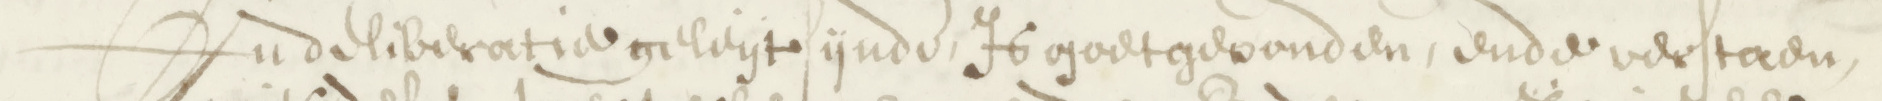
In deliberatie geleijt sijnde, Is goetgevonden, ende verstaen,
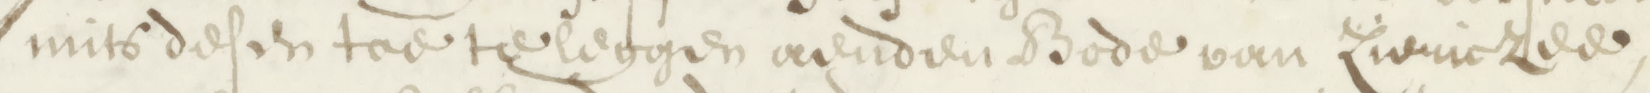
mits desen toe te leggen aenden Bode van ZiericZee
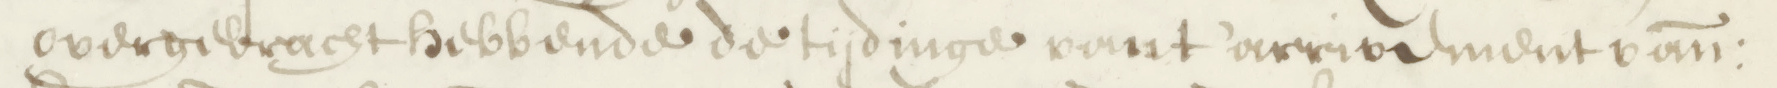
overgebracht hebbende de tijdinge vant' arrivement van:
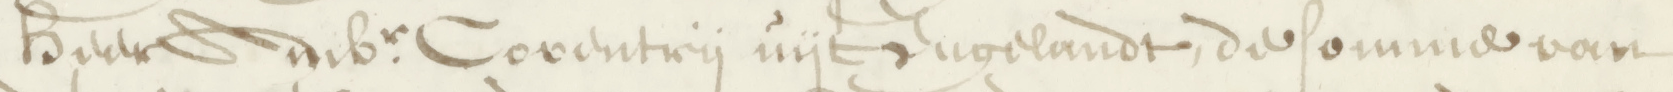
Heer Ambr. Coventrij uijt Engelandt, de somme van
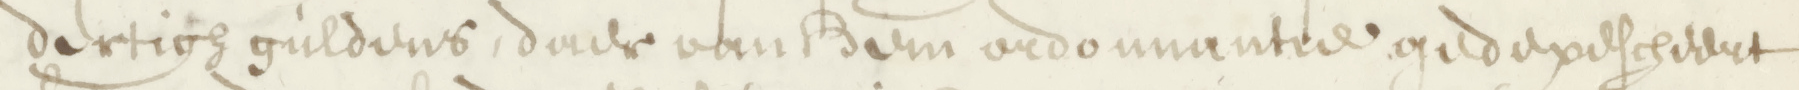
dertich guldens, daer van hem ordonnantie gedepescheert
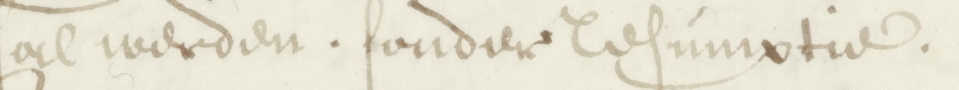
sal werden, sonder Resumptie.
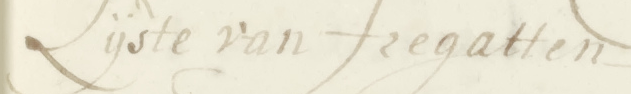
Lijste van Fregatten
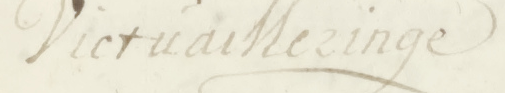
Victuailleringe
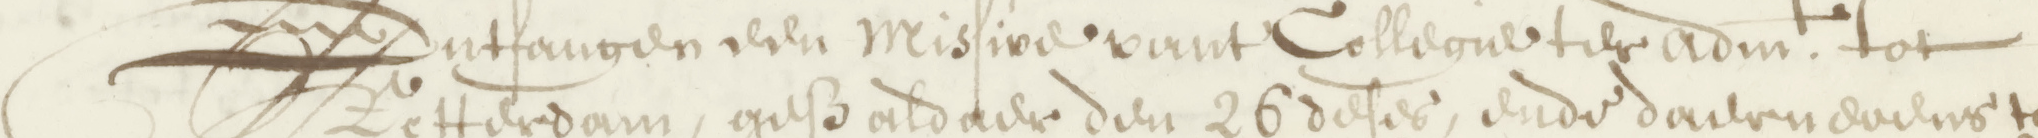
Ontfangen een Missive vant Collegie ter Admt. tot
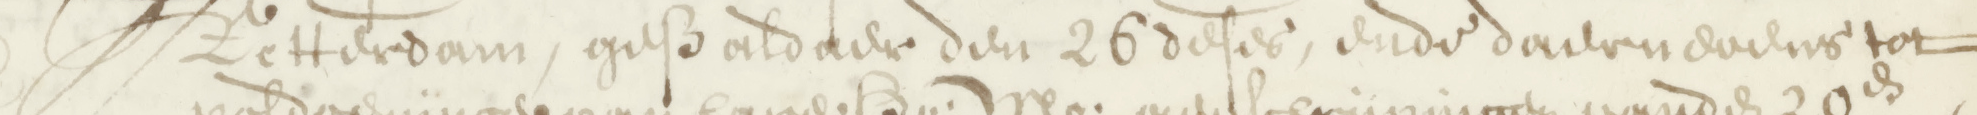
Rotterdam, ges aldaer den 26 deses, ende daernevens tot
